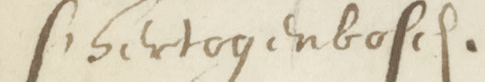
s‛hertogenbosch.
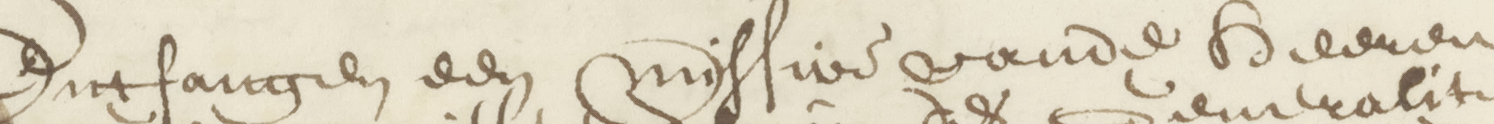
Ontfangen een missive vande Heeren
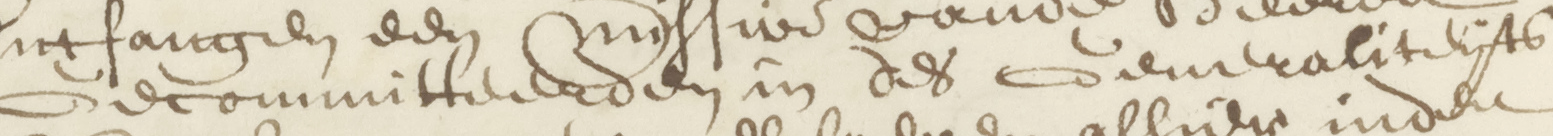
Gecommitteerden in des Generaliteijts
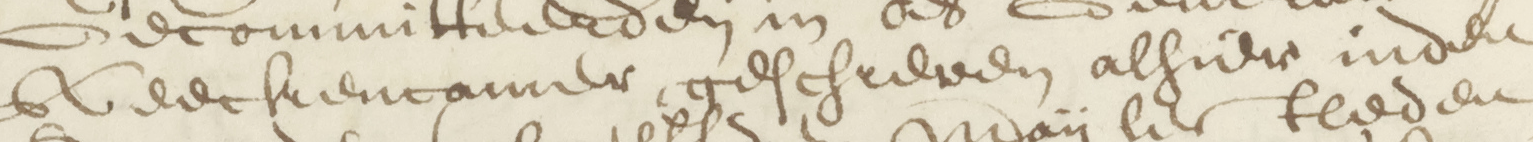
Reeckencamer, geschreven alhier inden
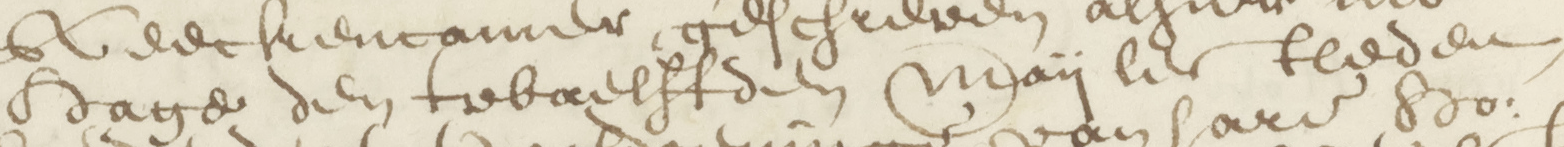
Hage den twaelffden Maij lestleden,
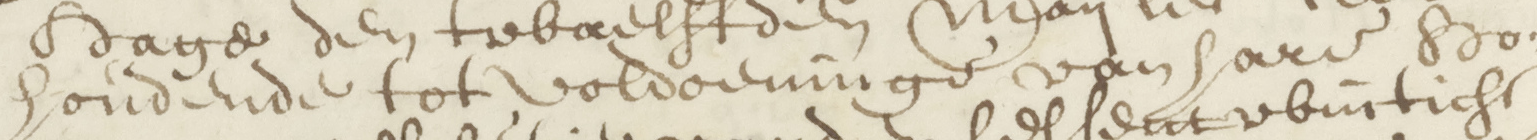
houdende tot voldoeninge van hare Ho:
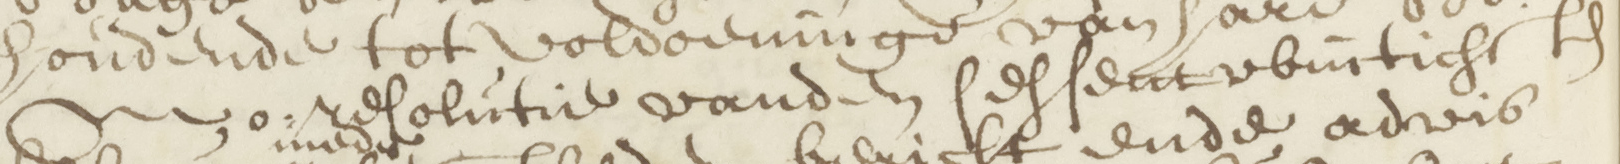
Mo: resolutie vanden sessentwintichsten
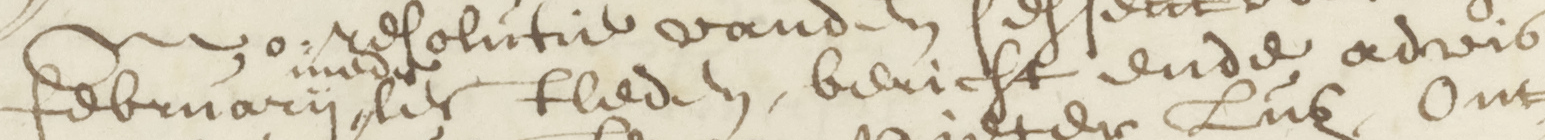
februarij#mede lestleden, bericht ende advis
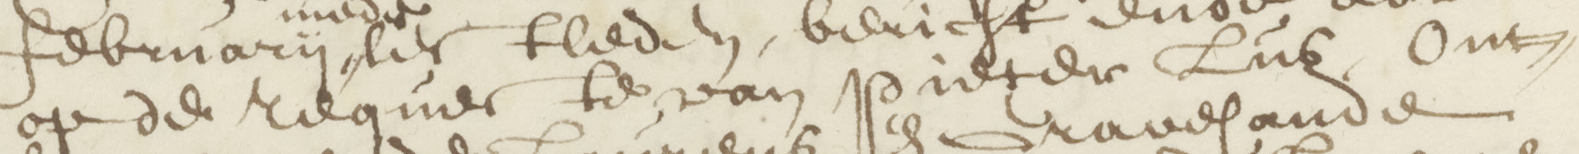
op de requeste van Pieter Lus, Ont„
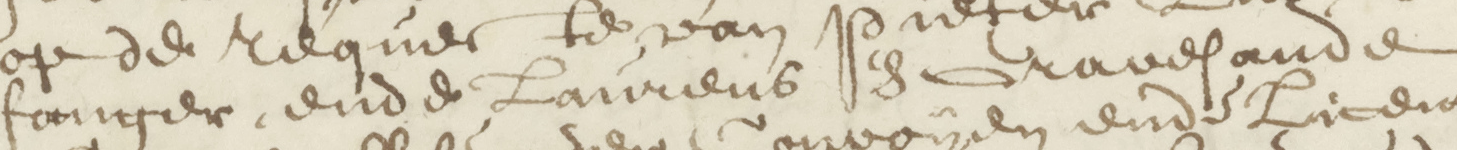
fanger, ende Laurens ‛S Gravesande
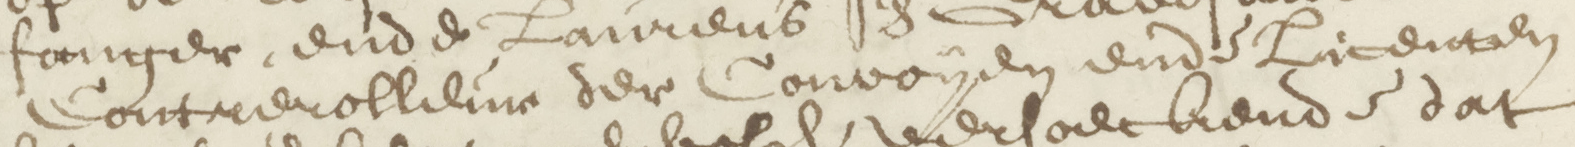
Contrerolleur der Convoijen ende Licenten
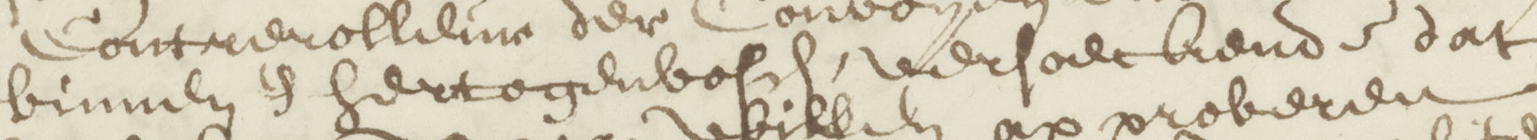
binnen ‛S hertogenbosch, versoeckende dat
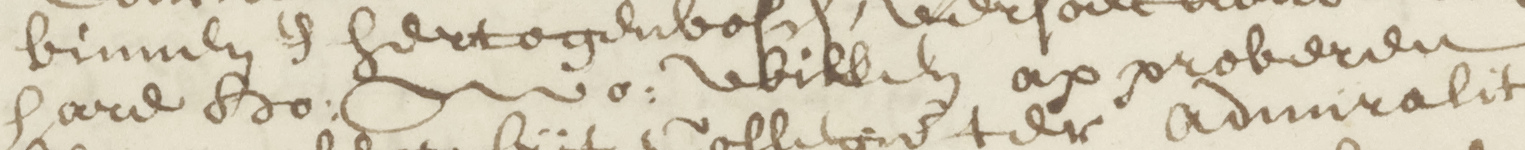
hare Ho:Mo: willen approberen
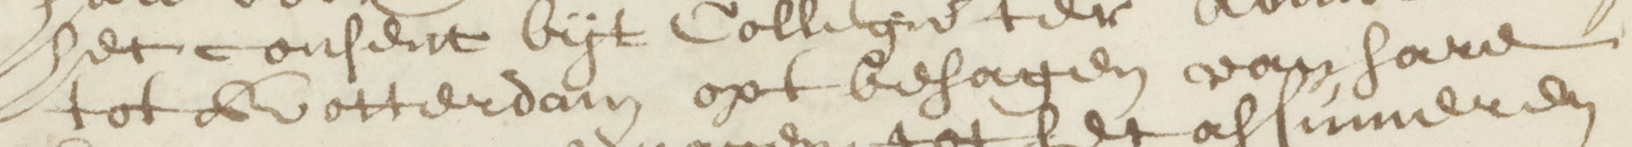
tot Rotterdam opt behagen van hare
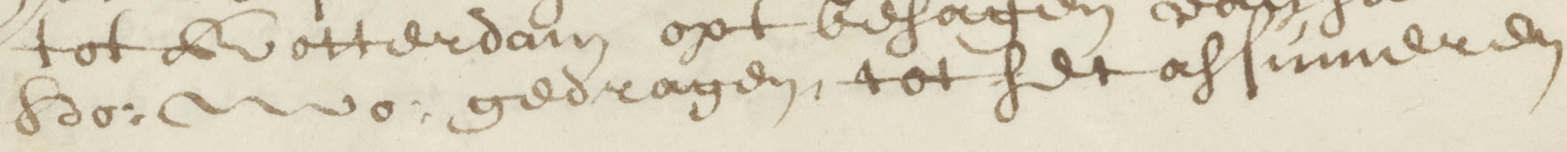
Ho:Mo: gedragen, tot het assumeren
